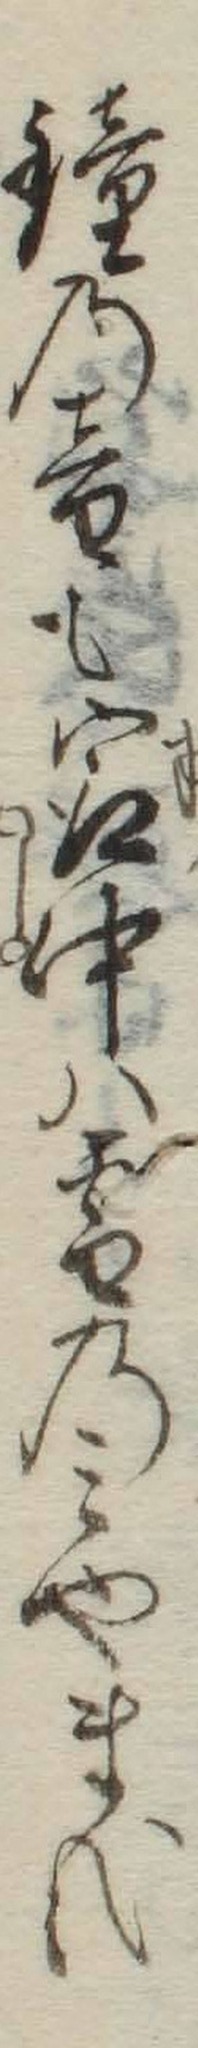鐘の音も最中は雪のみやま哉同
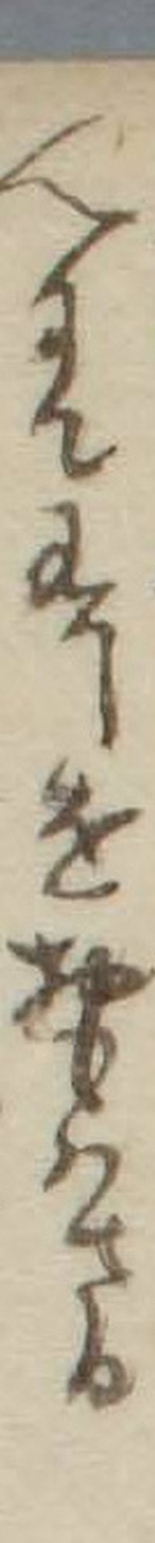人にて有しをおもはさる
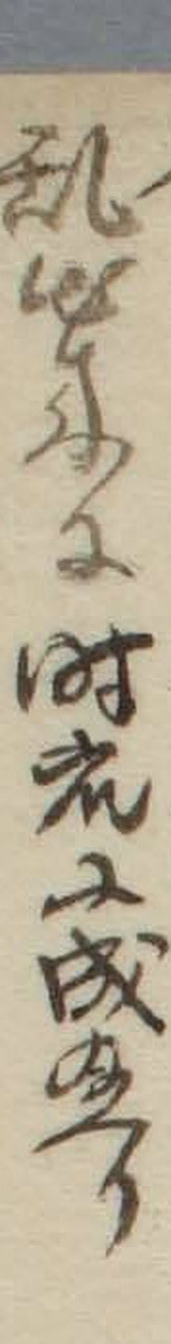乱世成に時衆に成給へり
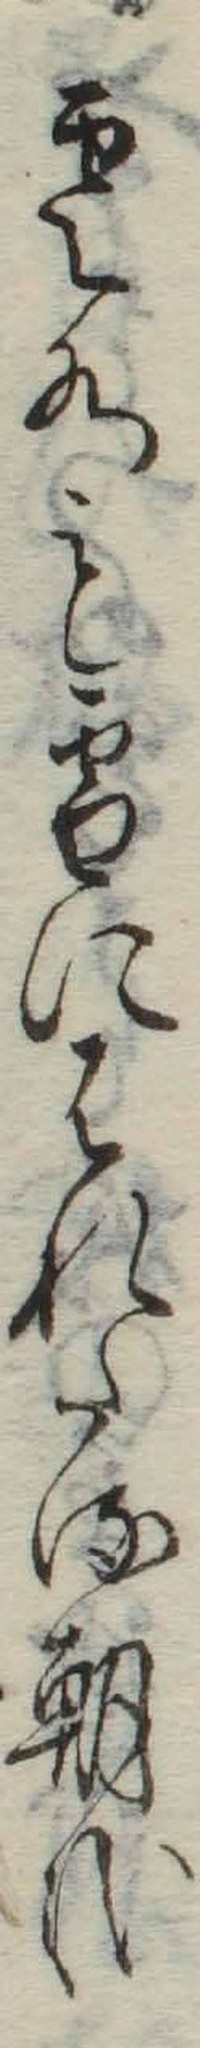雲水も雪にはれたる朝哉同
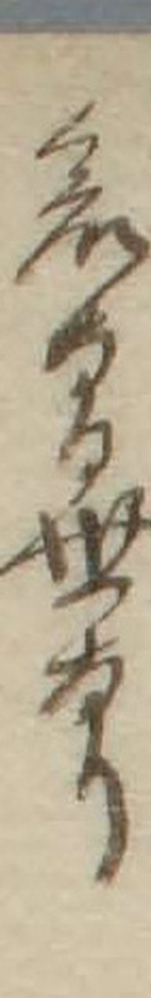哀なる世なり
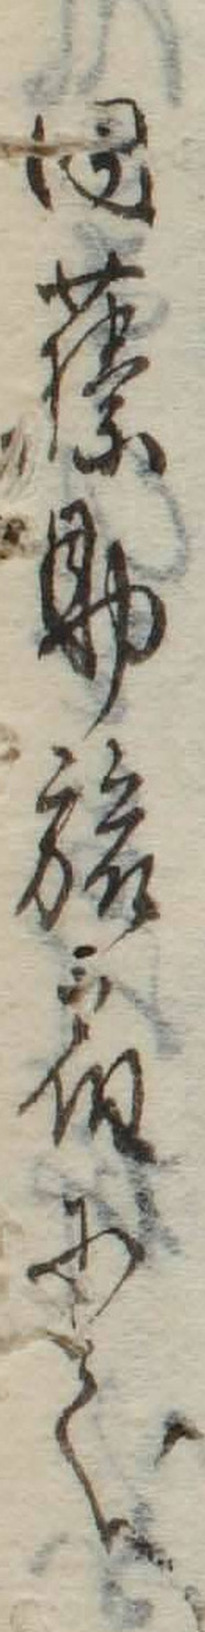同藤助旅宿にて

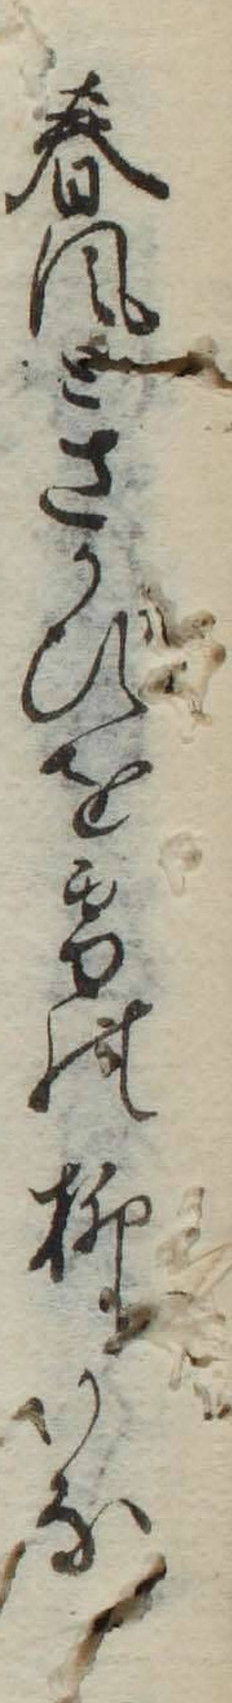春風とさかひを雪の柳かな宗牧
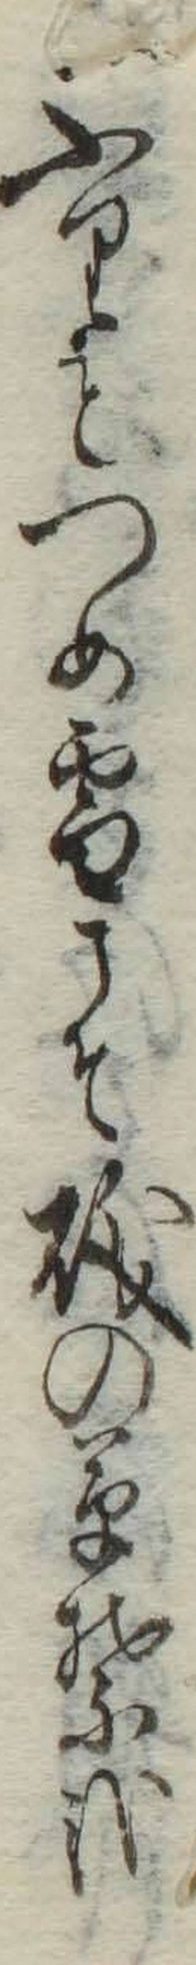ふりもつめ雪こその草葉哉同
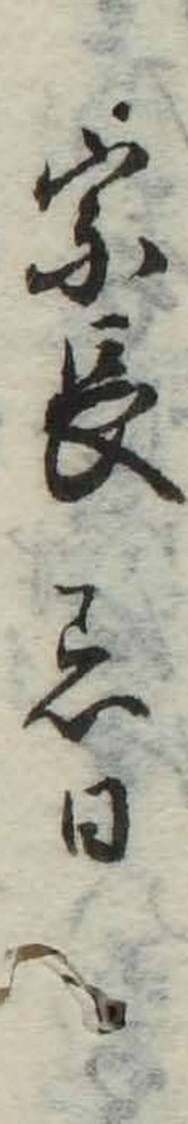宗長忌日
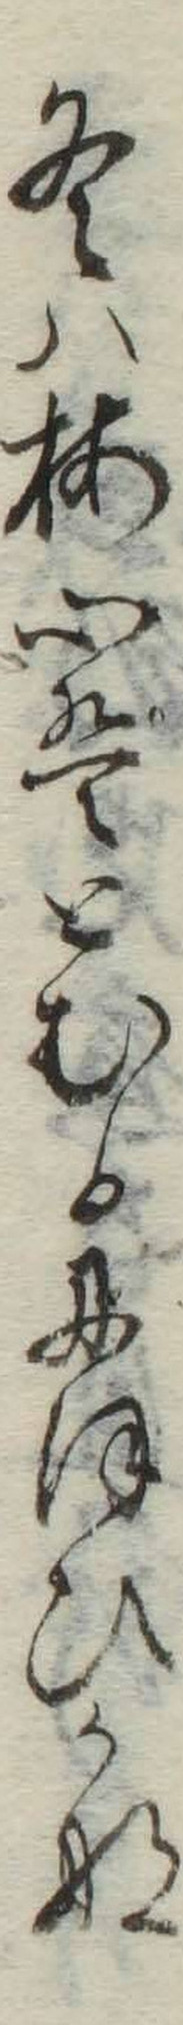冬は梅心はとむるにほひかな同
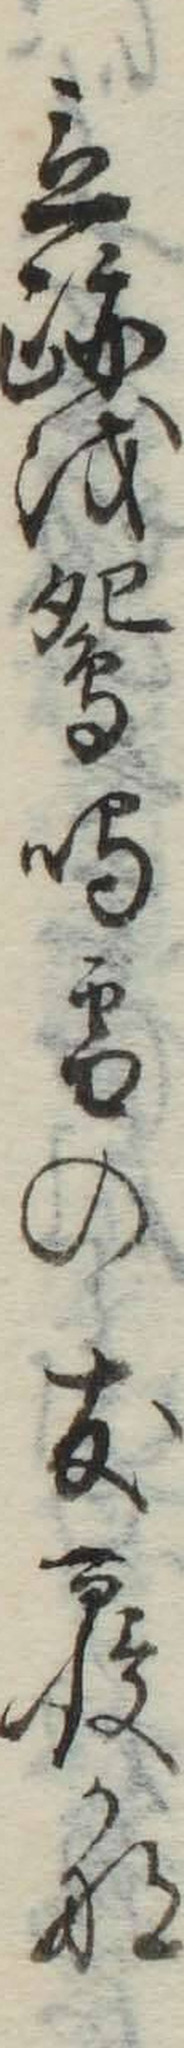立跡を鴛鳴雪の友寝かな同
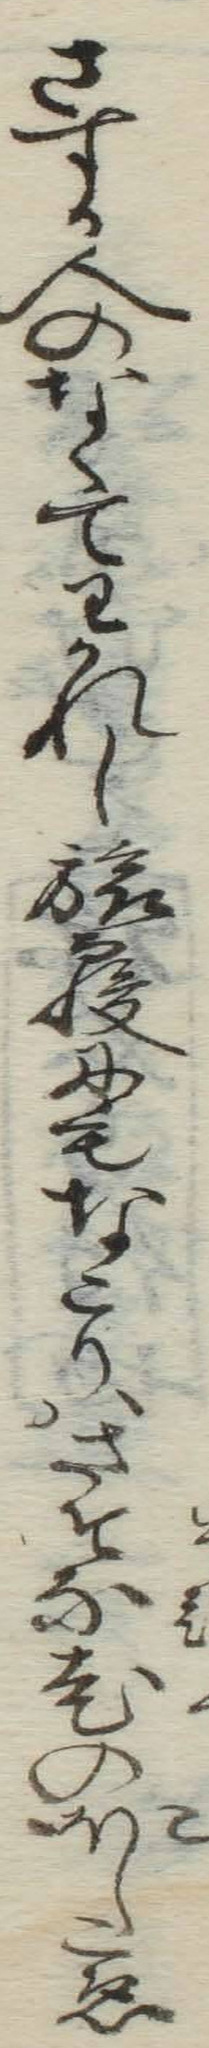さすか人のなくてわかれし旅寝にもなこりはさそな老のほしこゑ
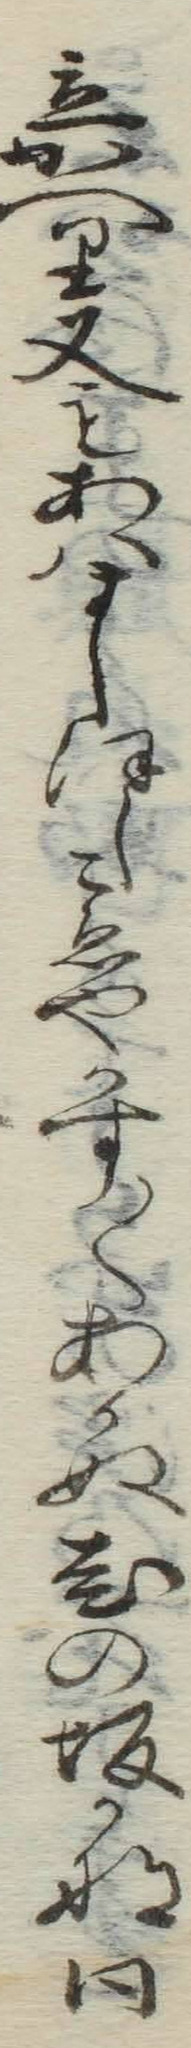立かへり又もあはましほしこゑやかす〳〵あかぬ老の坂かな同
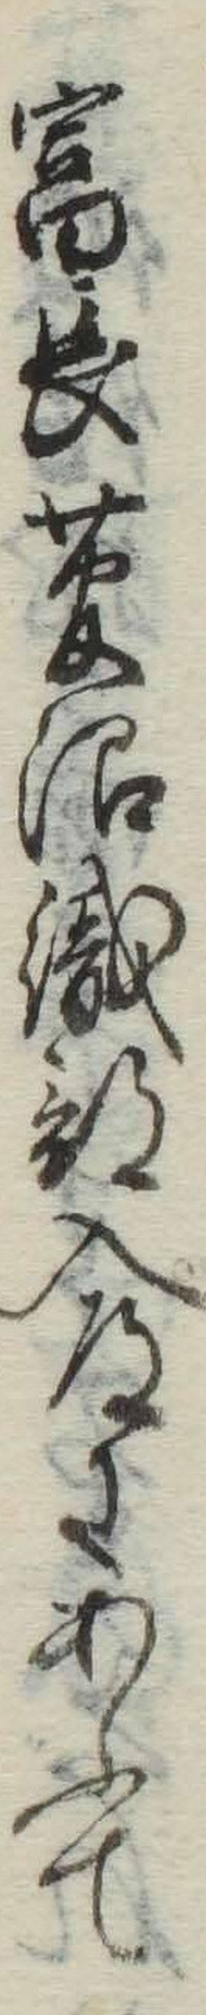富長菅沼織部入道にあふて
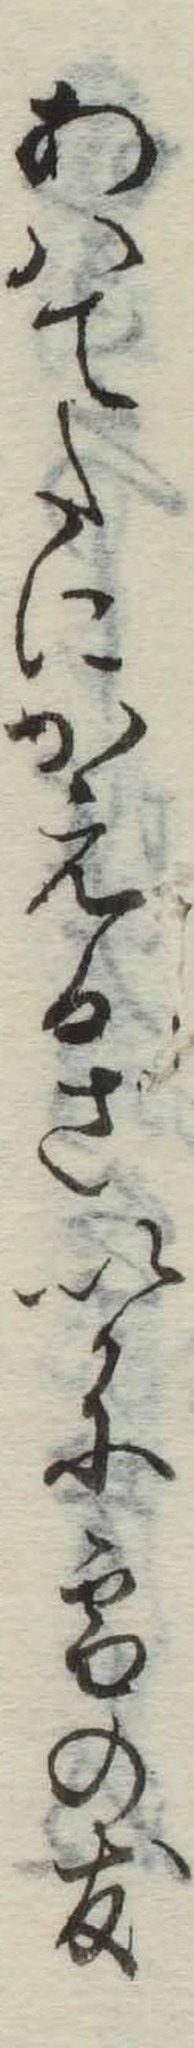あはてたにかえるさいかに雪の友同
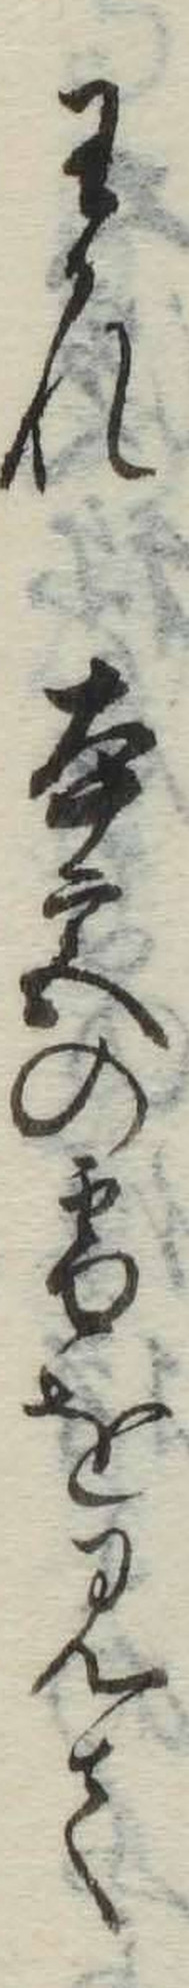わかれ本宮の雪を見て
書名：三河国二葉松
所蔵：国文学研究資料館
